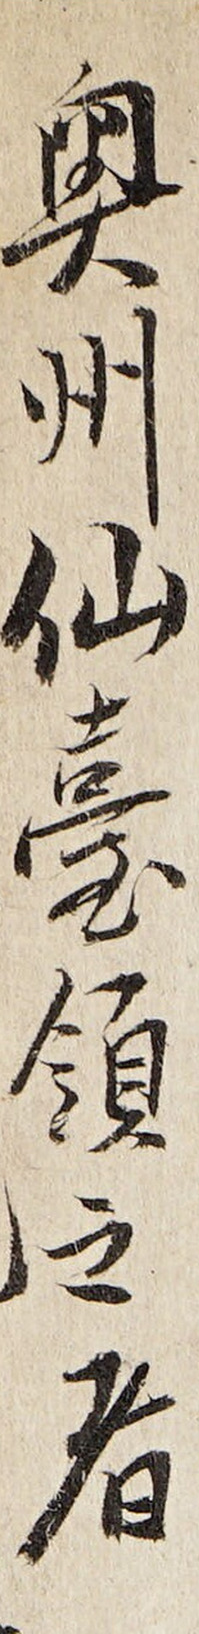奥州仙台領之者
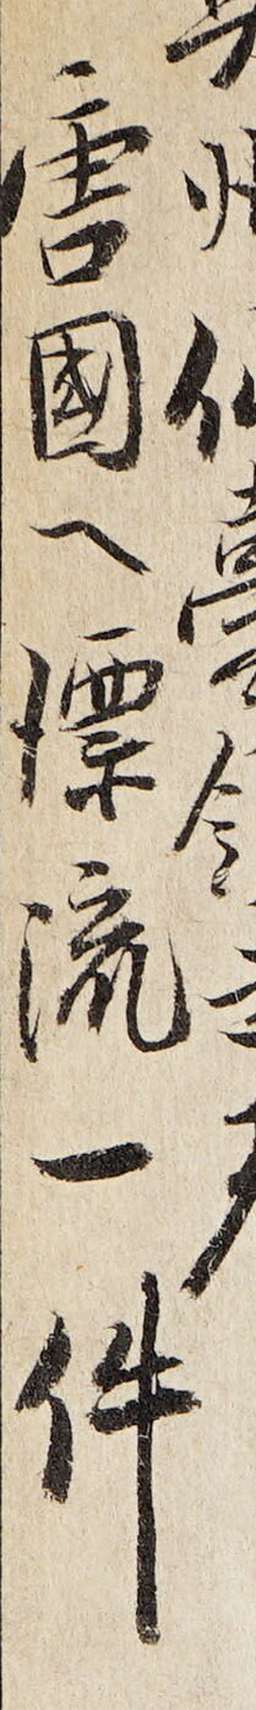唐国へ漂流一件

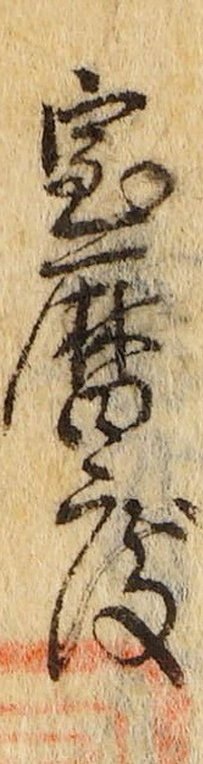宝暦度
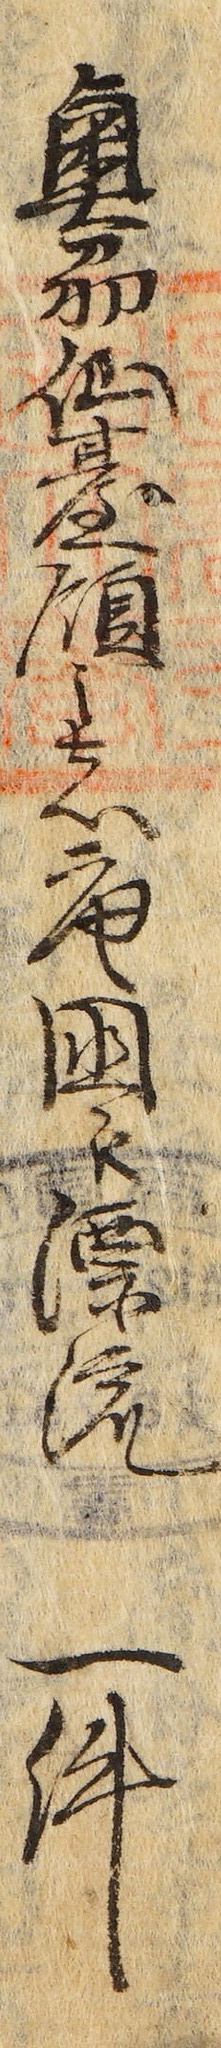奥州仙台領之者唐国江漂流一件
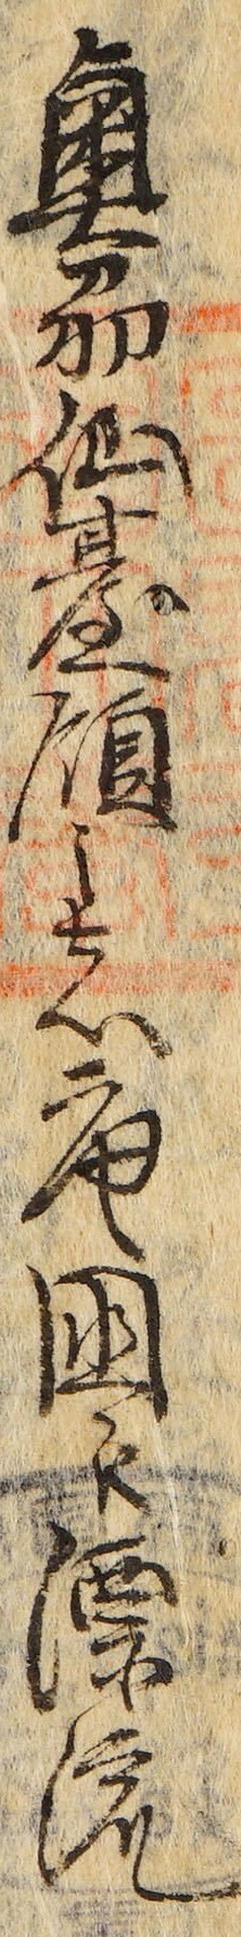奥州仙台領之者唐国江漂流一件

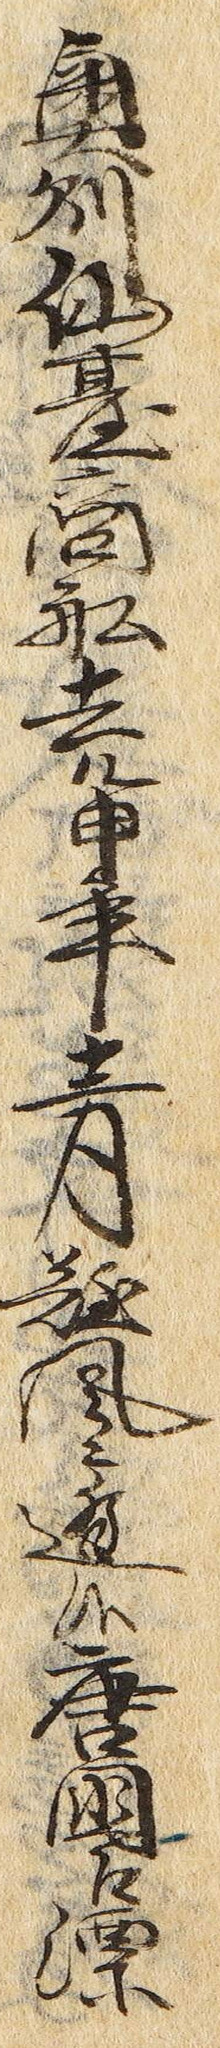奥州仙台商船去ル申年十二月難風ニ逢候唐国江漂
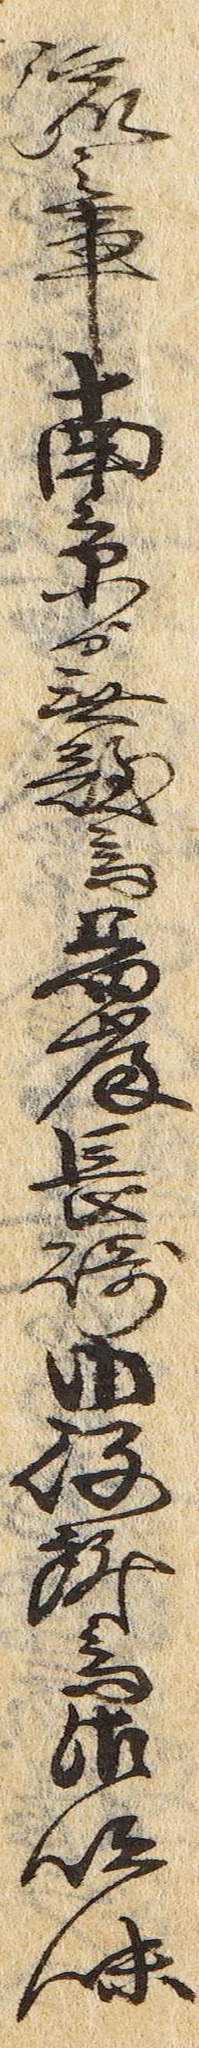流之事南京ゟ無難ニ而着岸長崎御役所ニ而御吟味
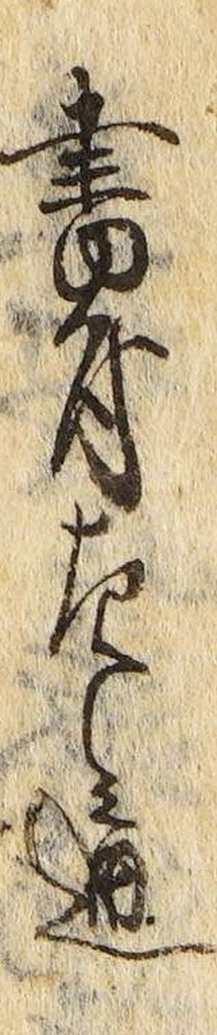書付左之通
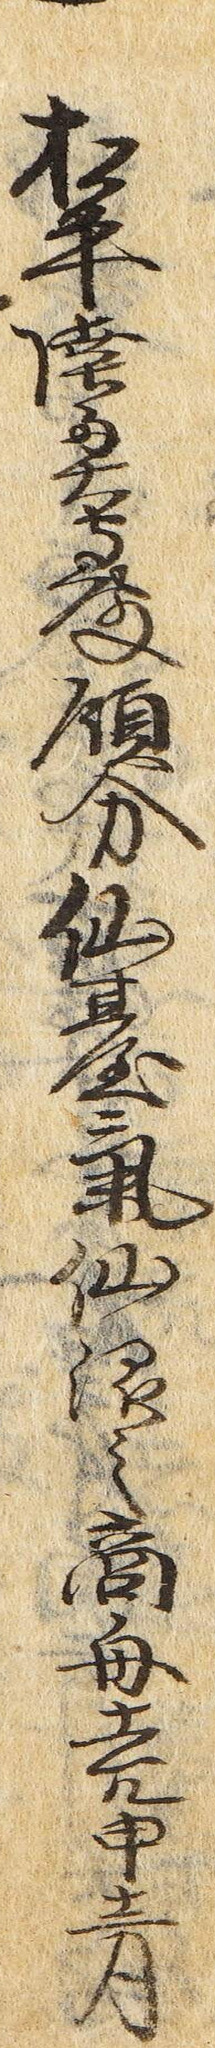一松平陸奥守殿領分仙台気仙沼之商舟去ル申十二月
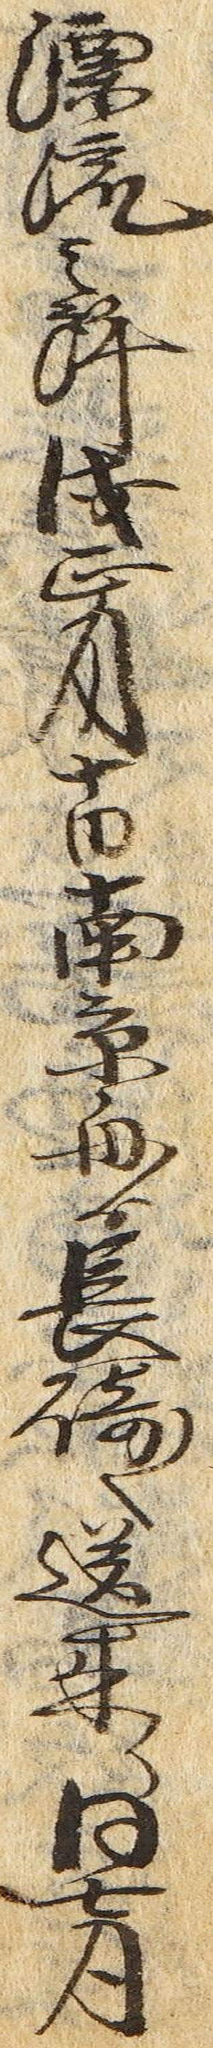漂流之所戌正月十日南京舟ゟ長崎へ送来り同七月
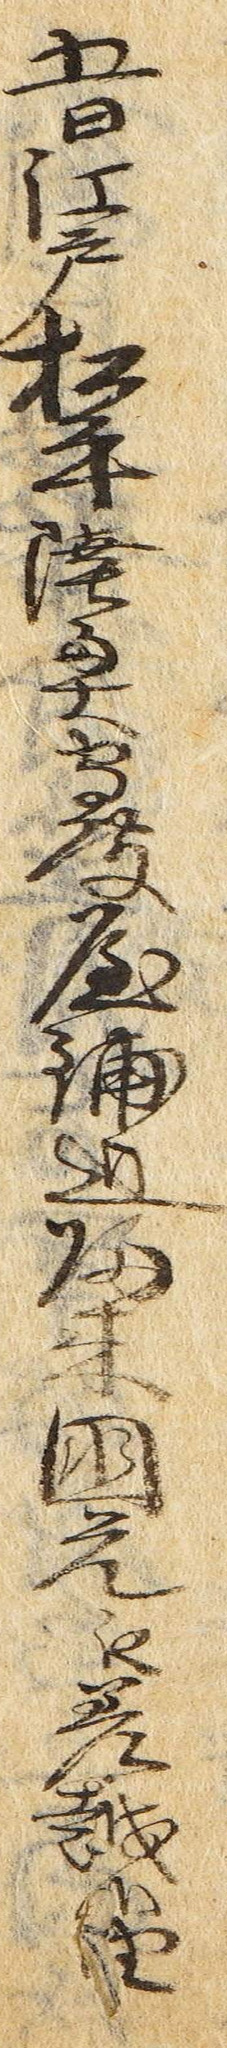五日江戸松平陸奥守殿屋鋪迄帰来国元江差越候由
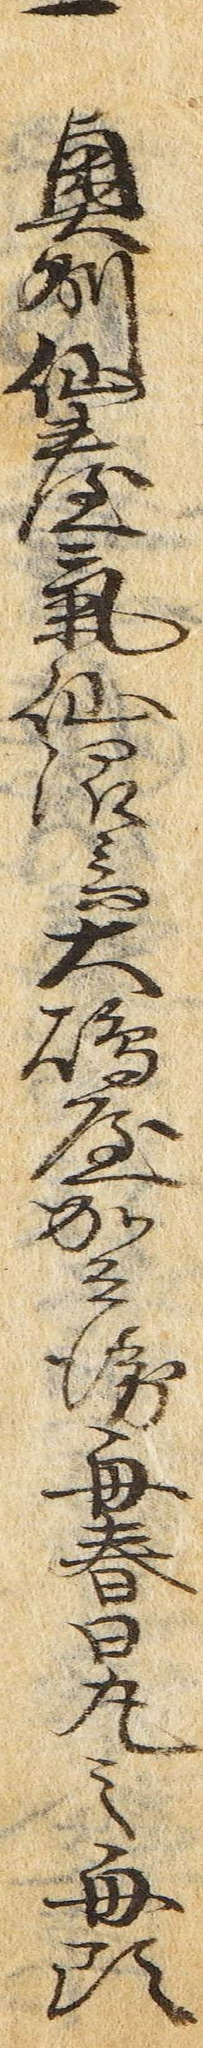一奥州仙台気仙沼ニ而大島屋加兵衛舟春日丸之舟頭
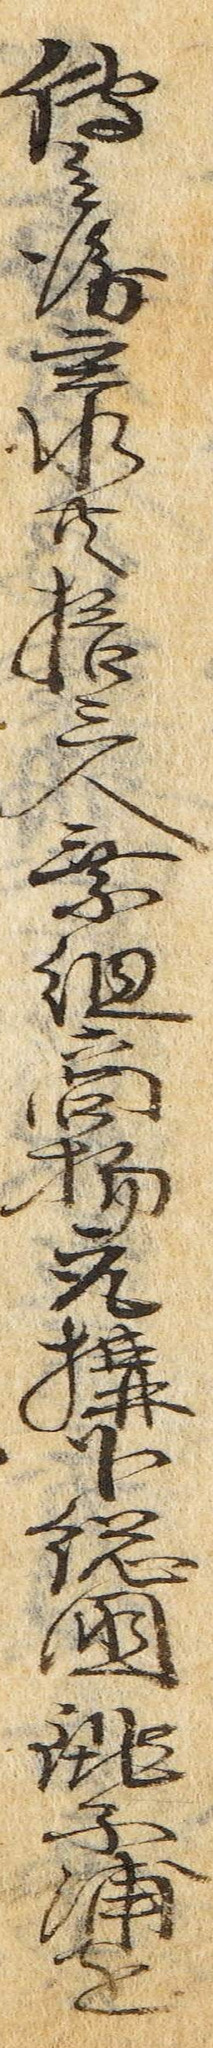伝兵衛主水共拾三人乗組商物取構下総国銚子浦を
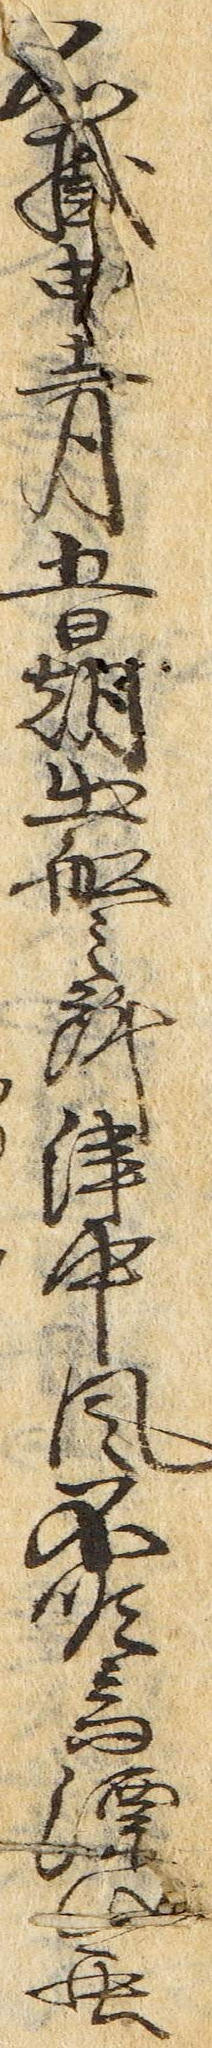心掛申十二月五日朝出船之所津中風不順ニ而漂ひ罷
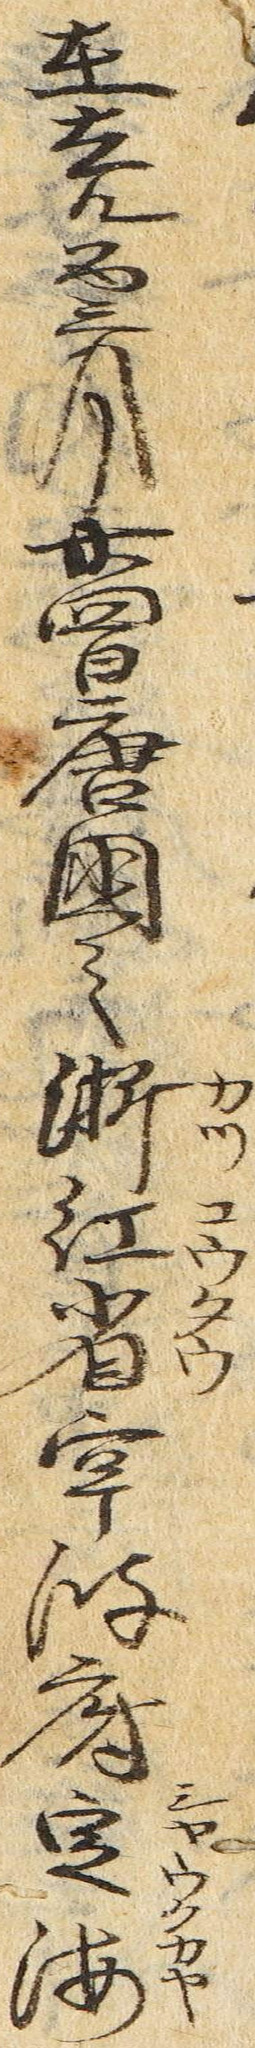在去ル酉三月廿四日唐国之浙江省寧波府定海

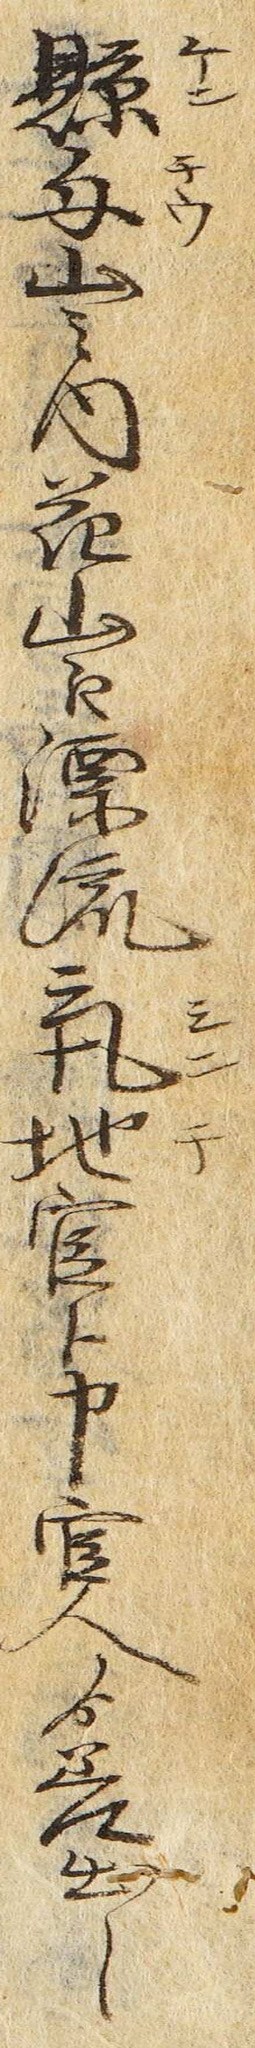県舟山之内花山江漂流気地官ト申官人ゟ差出し
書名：奥州仙台領之者唐国江漂流一件
